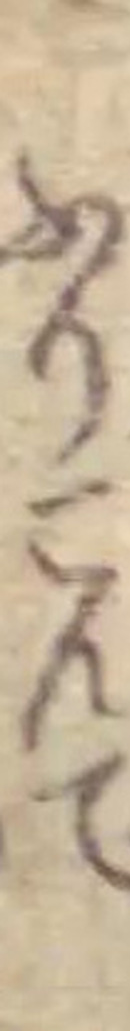ふりこんで
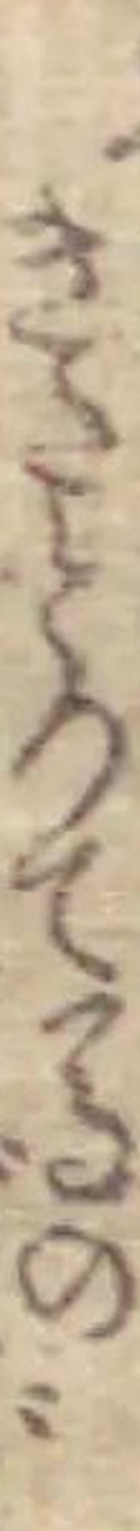きたとつて馬の
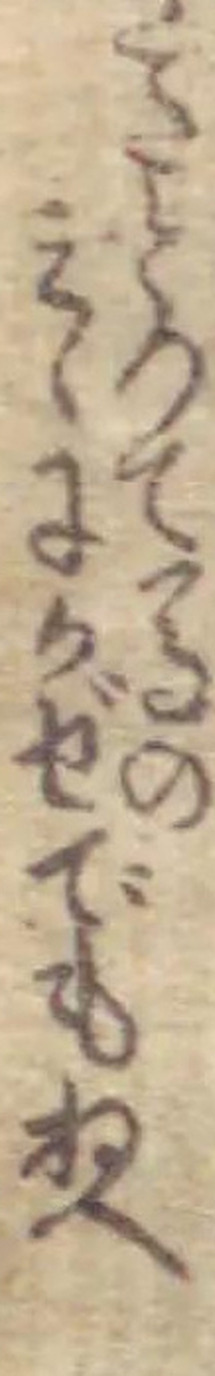みゝにかぜでもねへ

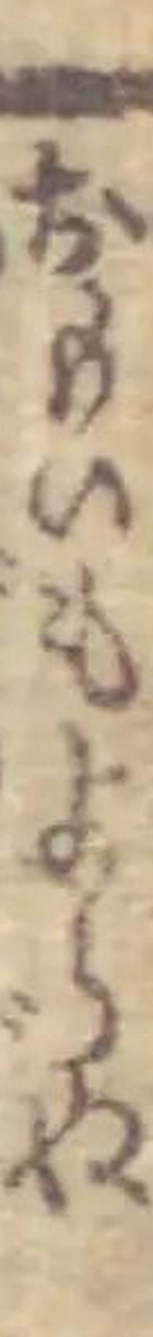おもいもよらぬ
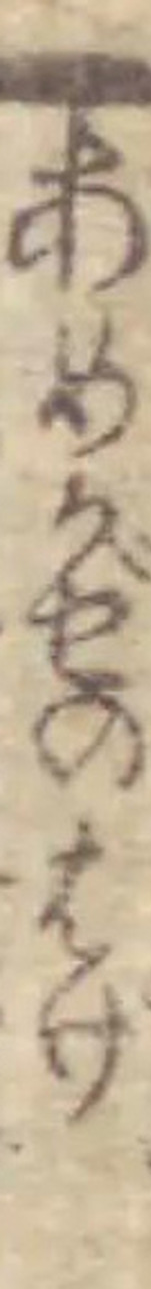あめかぜのはげ
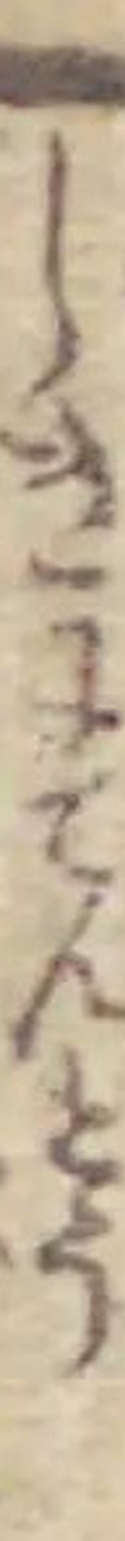しきにてんとう
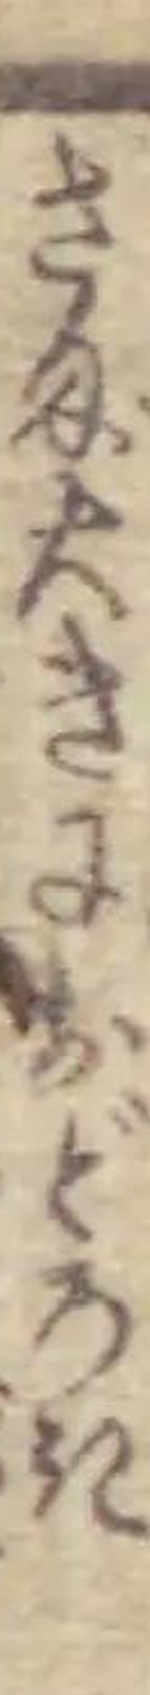さま大きにおどろき
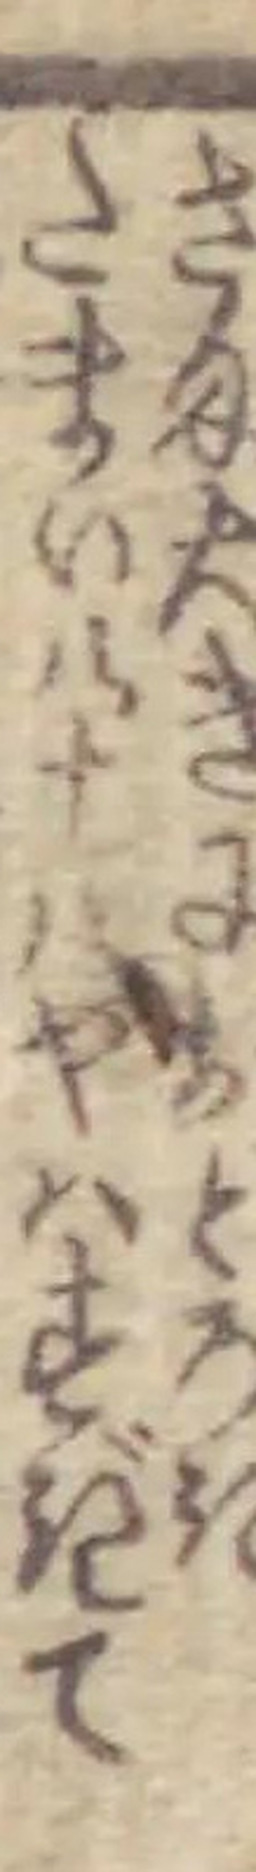たまい八十八やはすぎて
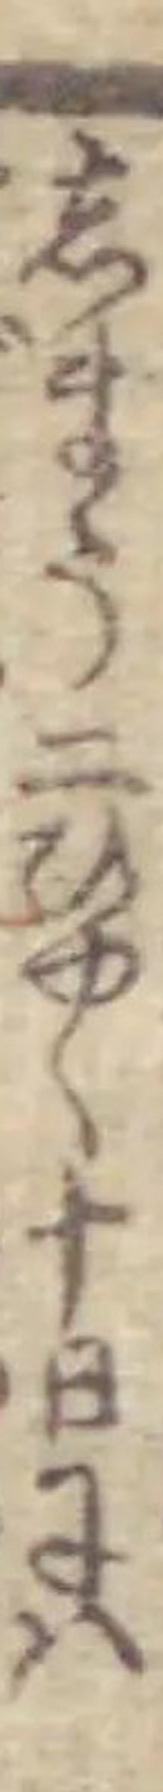しまう二ひやく十日には
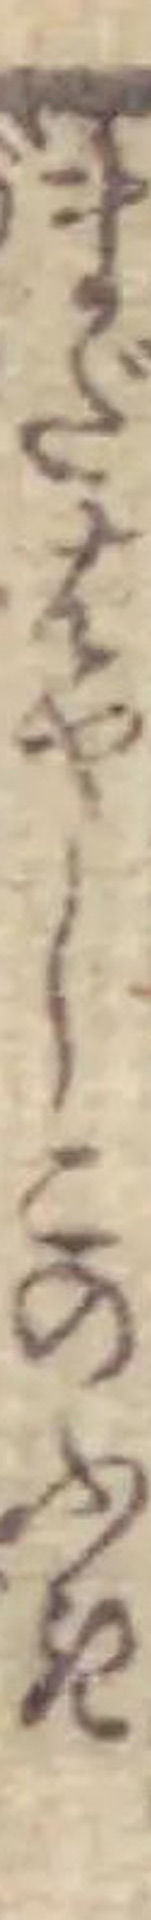まだはやしこのふき
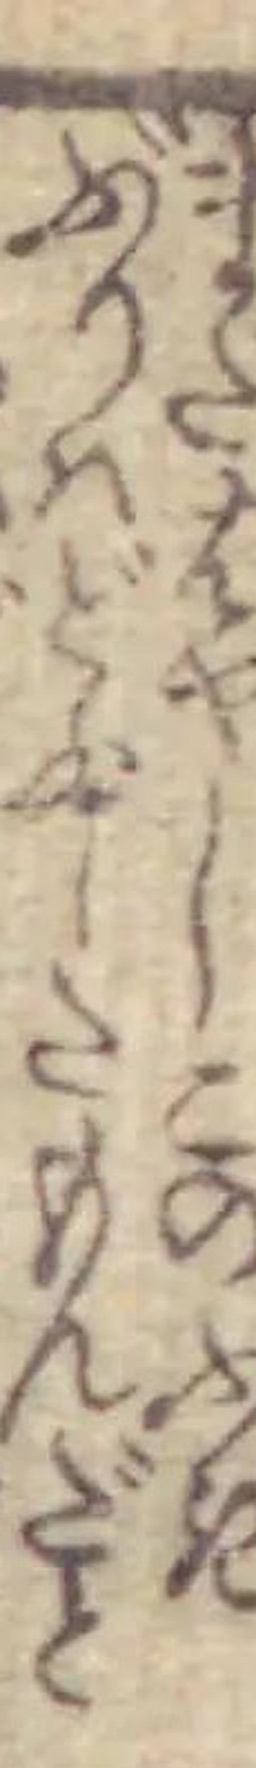ぶりはどふしたもんだと
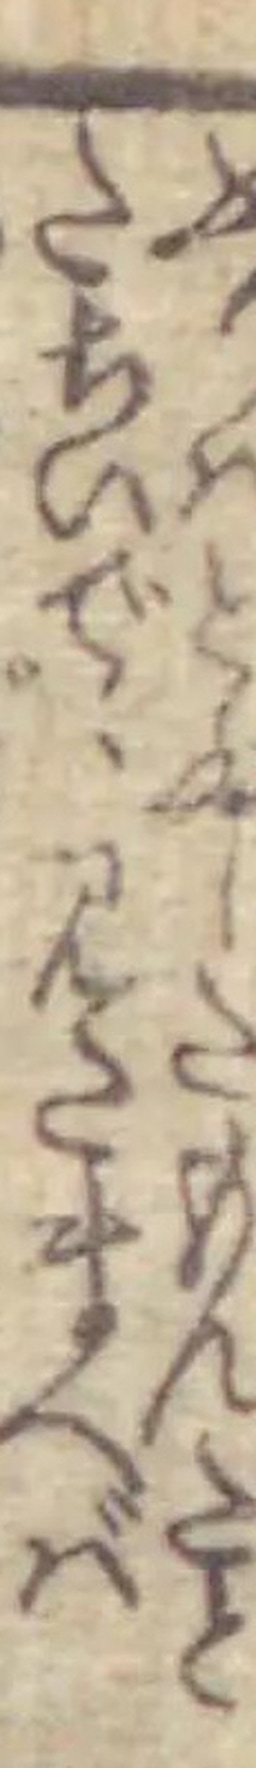たちいでゝ見たまへば
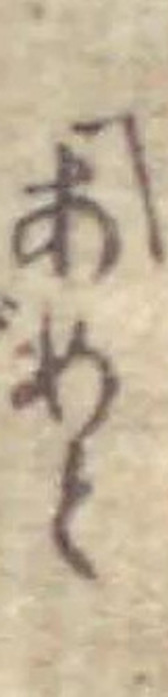〽あめと
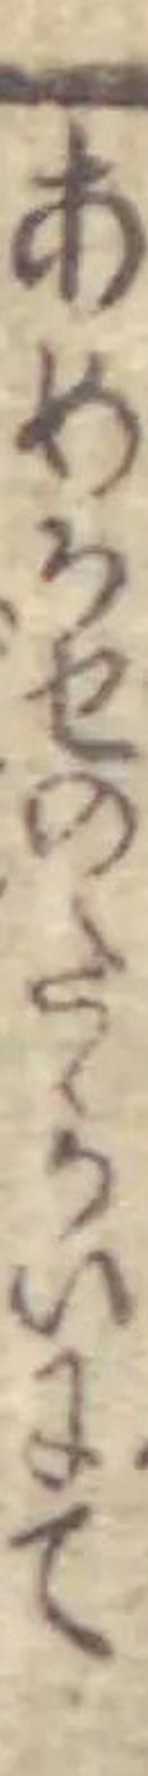あめかぜのたゝかいにて
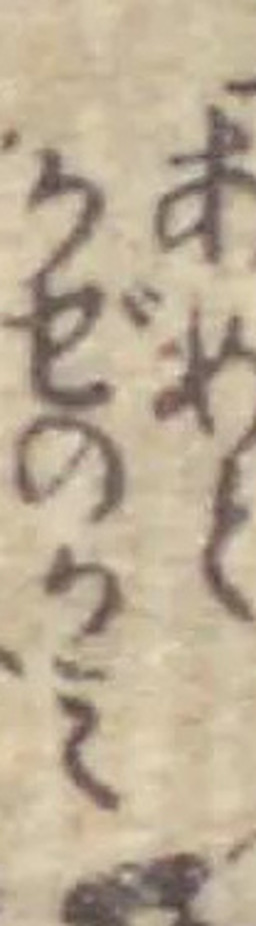かぜのかみ
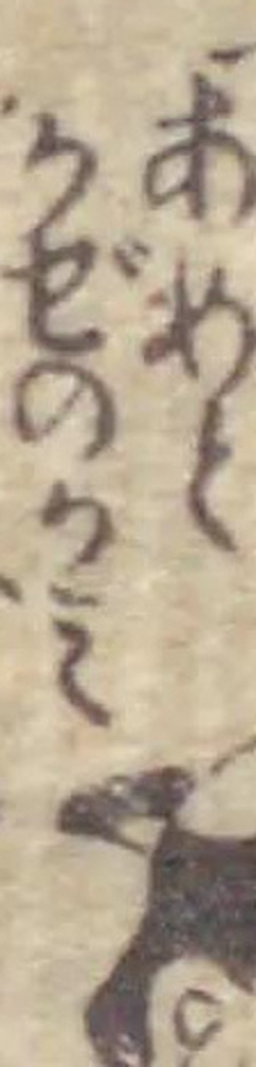かぜのかみ
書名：雨宮風宮出儘略縁記 3巻
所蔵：国立国会図書館 National Diet Library, JAPAN
